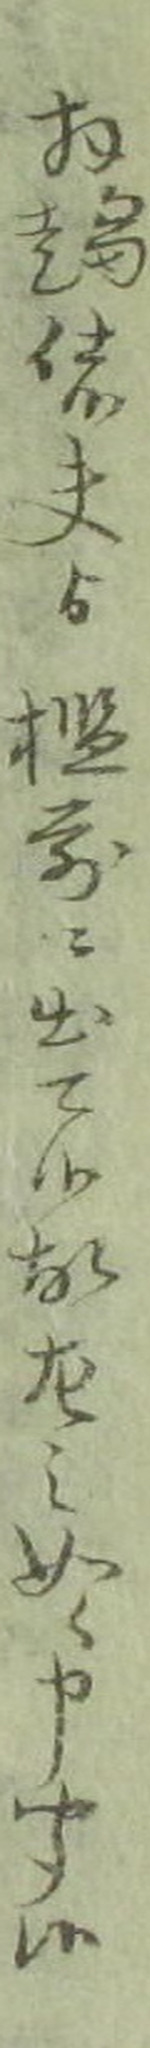拝趨仕候夫ゟ檻前に出て候故左之如く申聞候
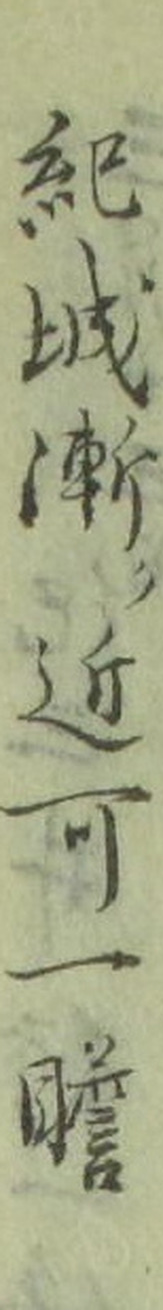紀城漸近可一胆
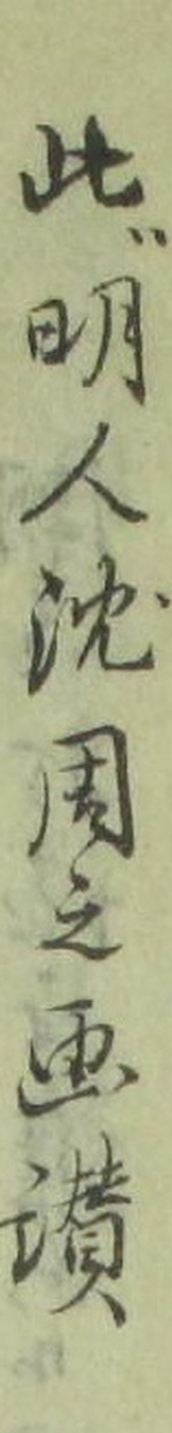此明人沈周之画讃
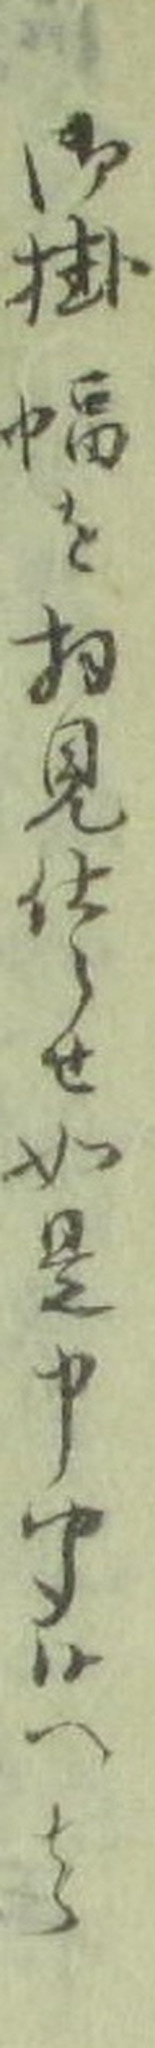御掛幅を拝見仕らせ如是申聞候へは
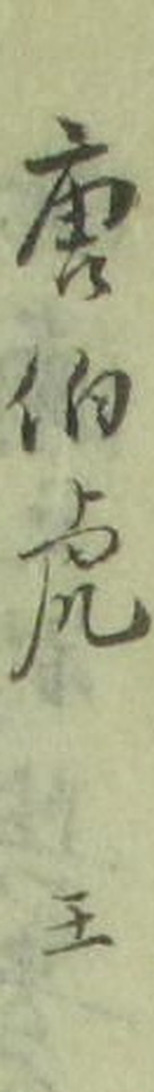唐伯虎王
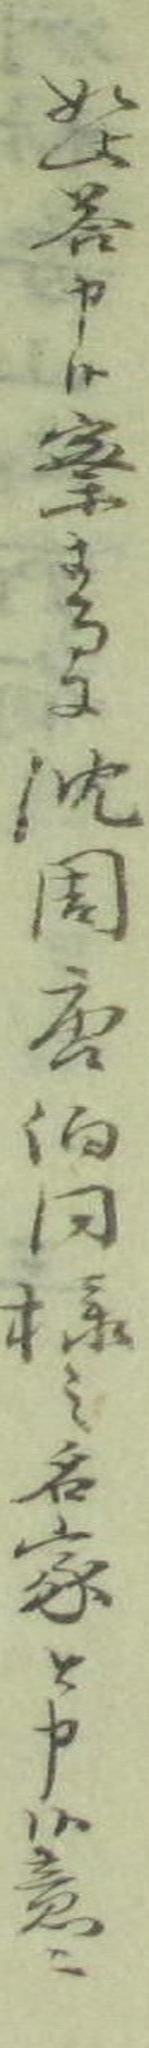如此答申候察するに沈周唐伯同様之名家と申候意に
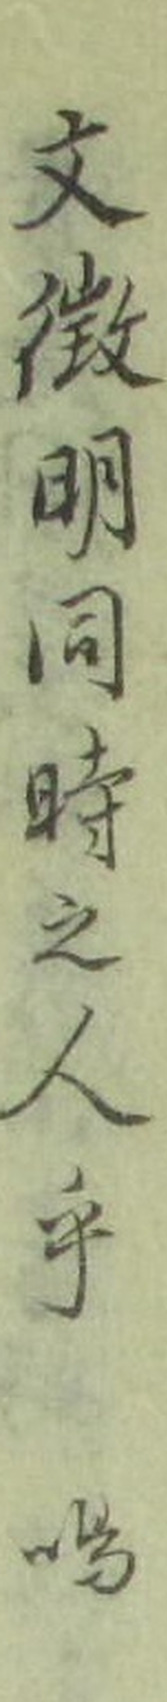文徴明同時之人乎鳴
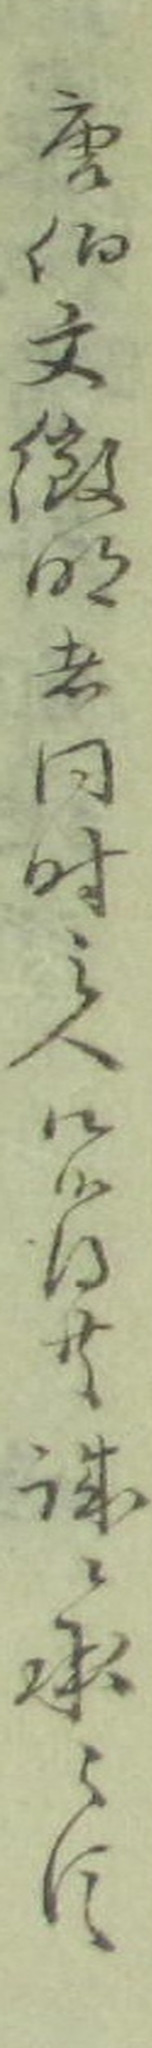唐伯文徴明者同時之人に候得共誠ニ承らす
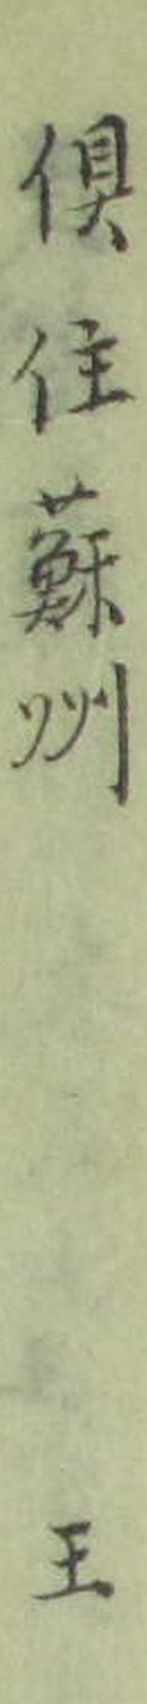倶住蘇州王
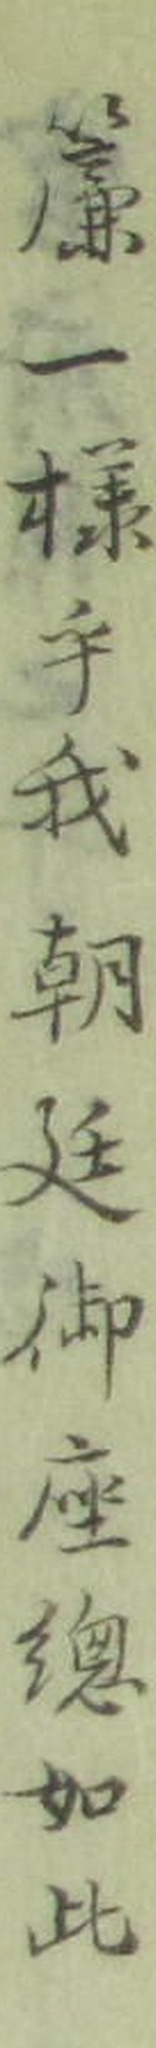簾一様乎我朝廷御座総如此鳴
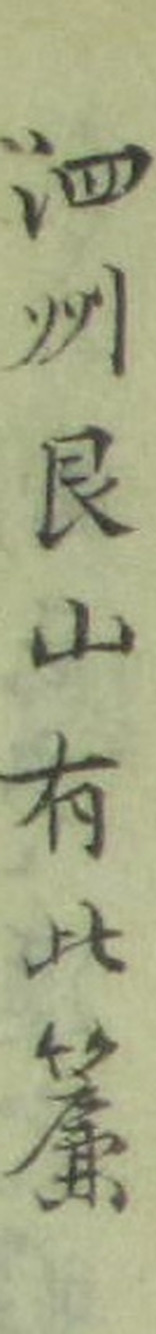泗州艮山有此簾王

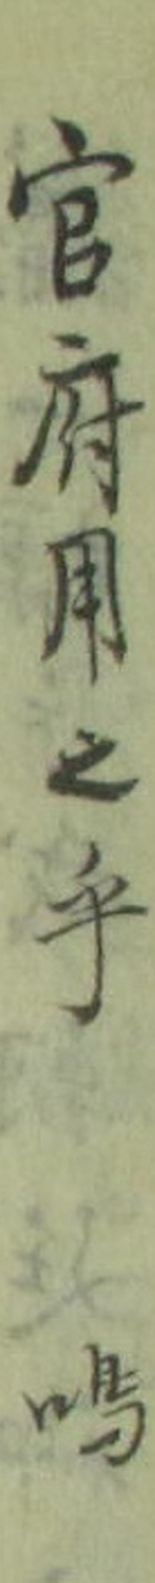官府用之乎鳴
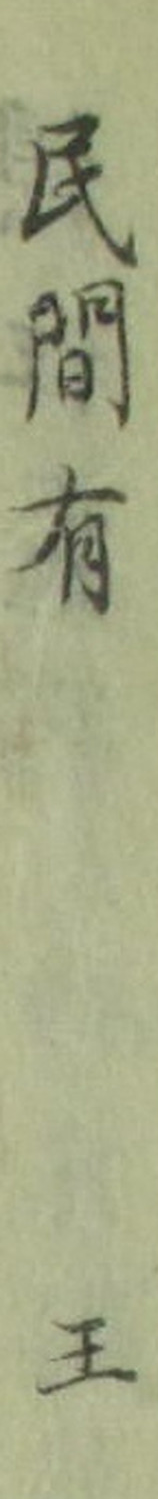民間有王
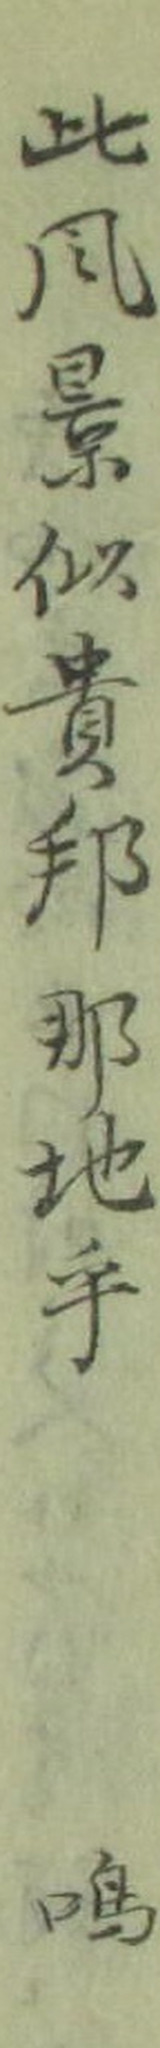此風景似貴邦那地乎鳴
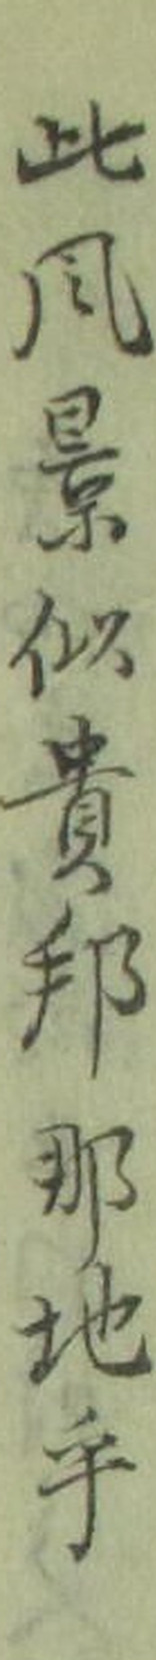此風景似貴邦那地乎鳴
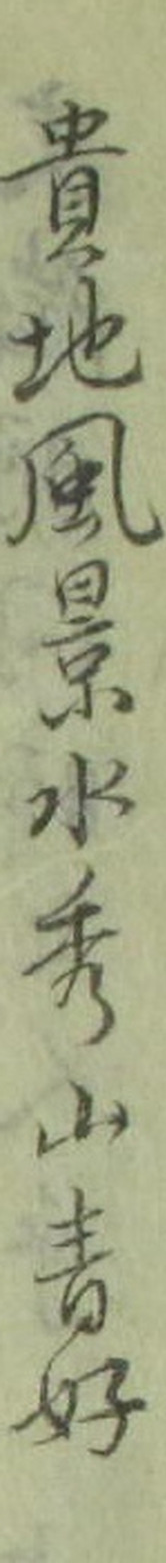貴地風景水秀山青好王
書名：紀州九木浦庄屋記録 四
